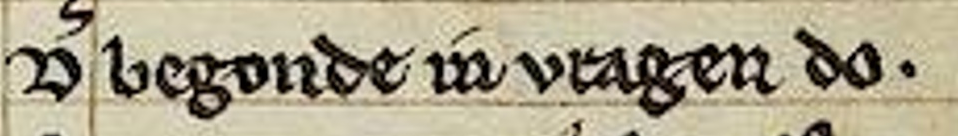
D(er) begonde in vragen do.
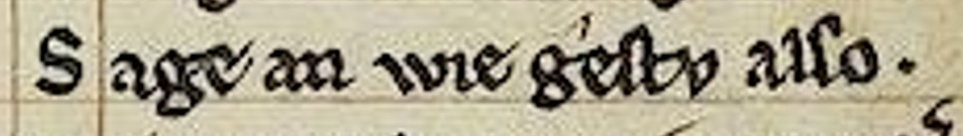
Sage an wie geſtv alſo.
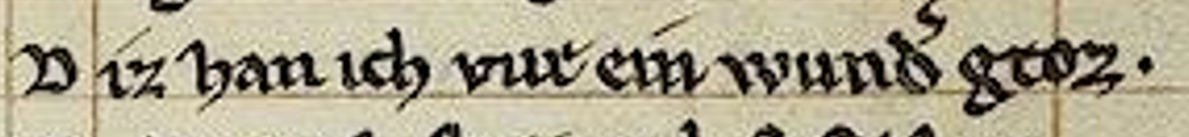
Diz han ich vur ein wund(er) groz.
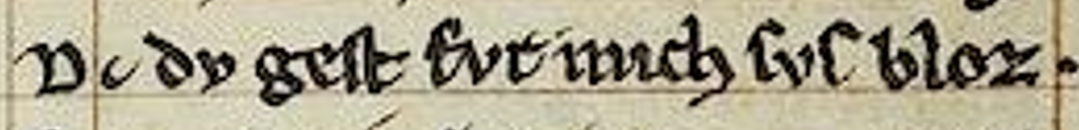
D(az) dv geſt fvr mich ſvſ bloz.
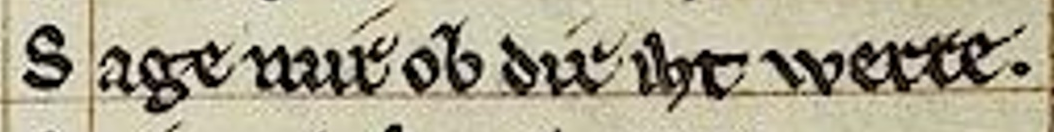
Sage mir ob dir iht werre.
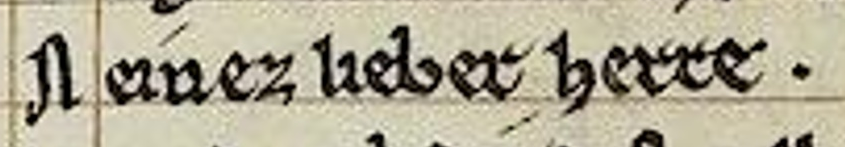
Neinez lieber herre.
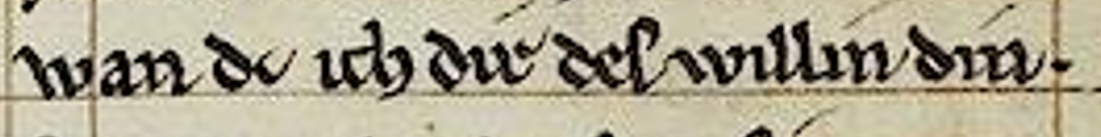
Wan (daz) ich dir deſ willin din.
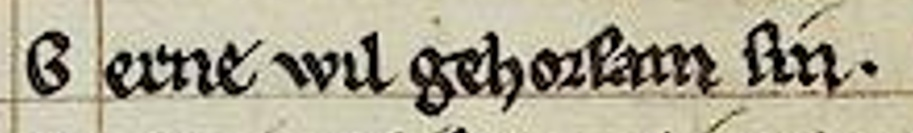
Gerne wil gehorſam ſin.
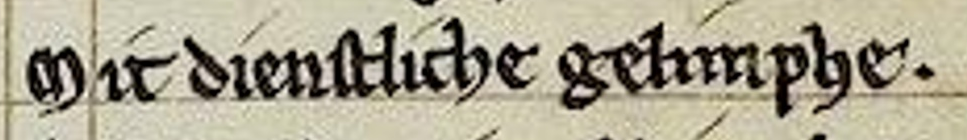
Mit dienſtliche gelimphe.
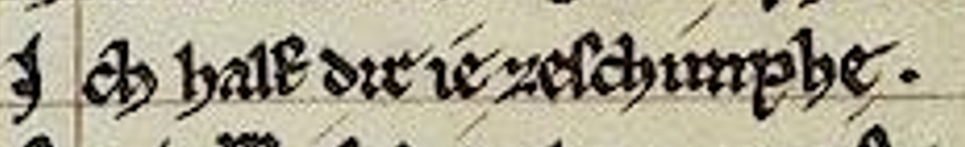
Ich half dir ie zeſchimphe.
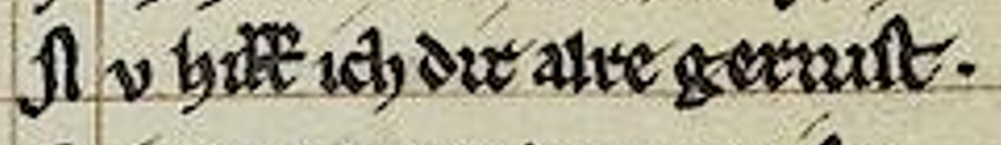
Nv hiff ich dir alre gerniſt.
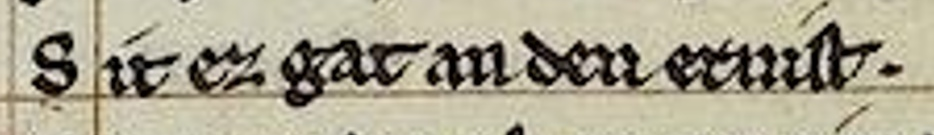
Sit ez gaz an den erniſt.
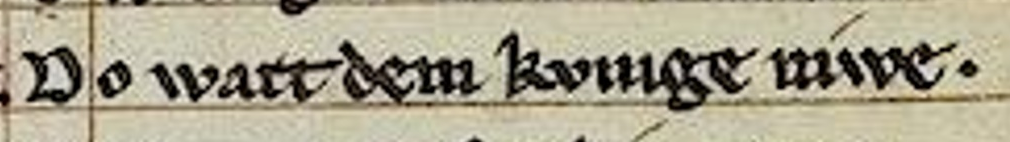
Do wart dem kvnige niwe.
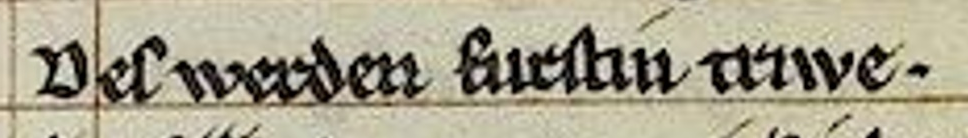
Deſ werden furſtin triwe.
